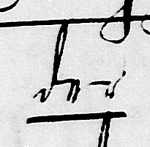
der
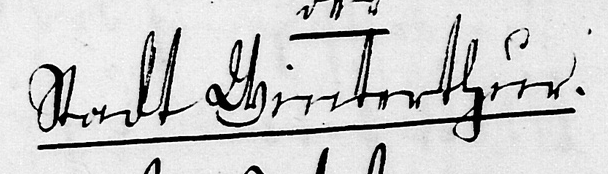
Stadt Winterthur.
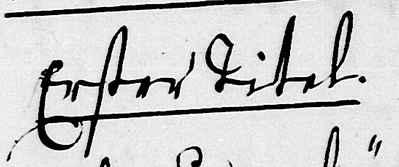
Erster Titel.
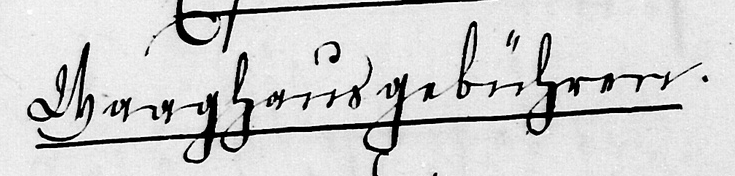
Waaghausgebühren.
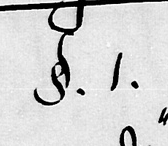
§. 1.
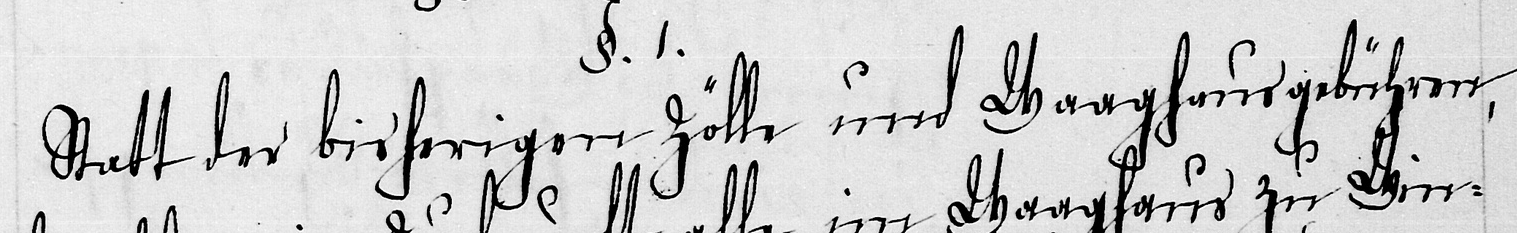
Statt der bisherigen Zölle und Waaghausgebühren,
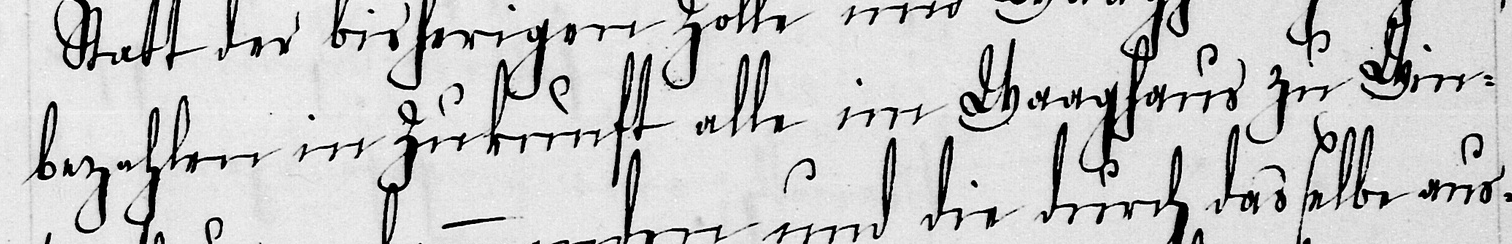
bezahlen in Zukunft alle im Waaghaus zu Win¬
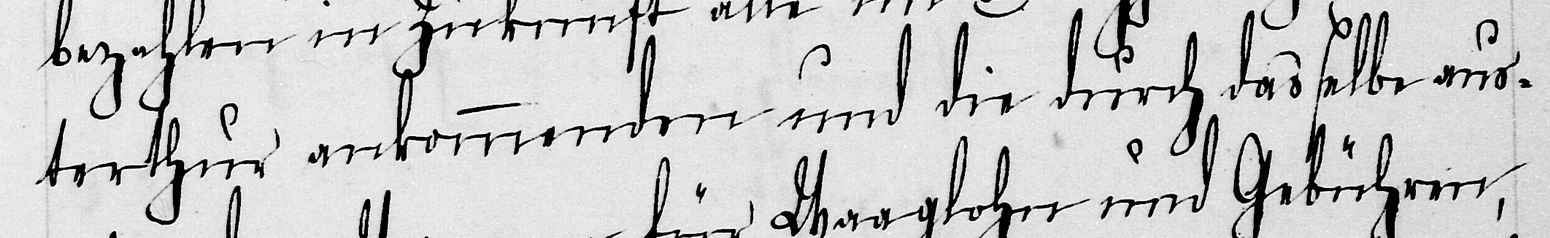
terthur ankommenden und die durch dasselbe aus¬
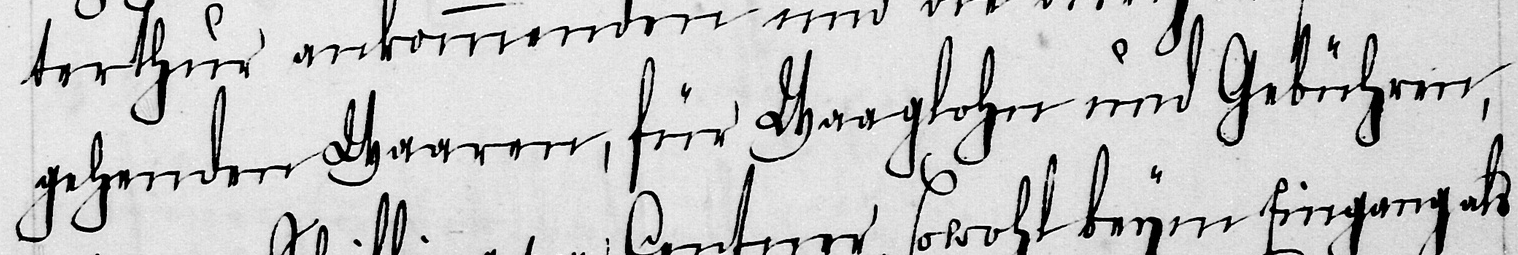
gehenden Waaren, für Waaglohn und Gebühren,
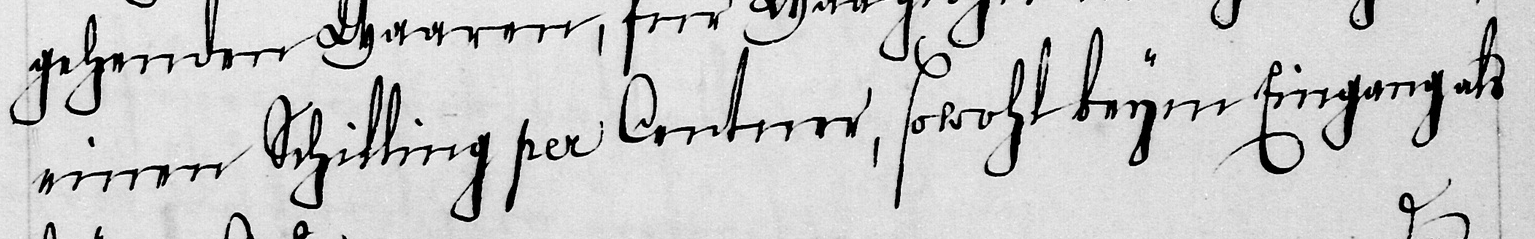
einen Schilling per Centner, sowohl beym Eingang als
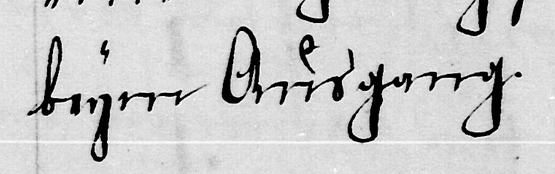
beym Ausgang.
